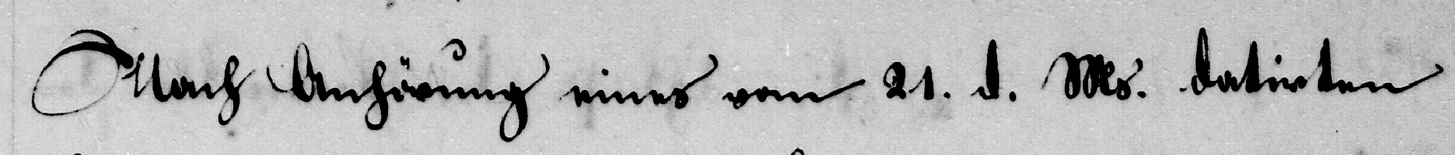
Nach Anhörung eines vom 21. d. Ms. datirten
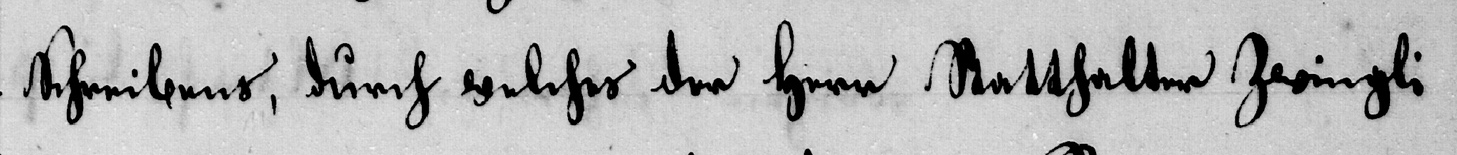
Schreibens, durch welches der Herr Statthalter Zwingli
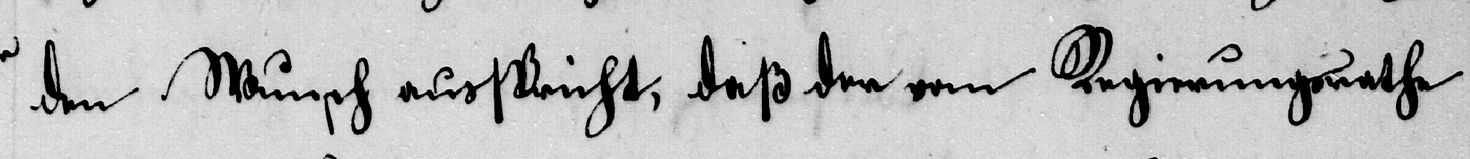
den Wunsch ausspricht, daß der vom Regierungsrathe
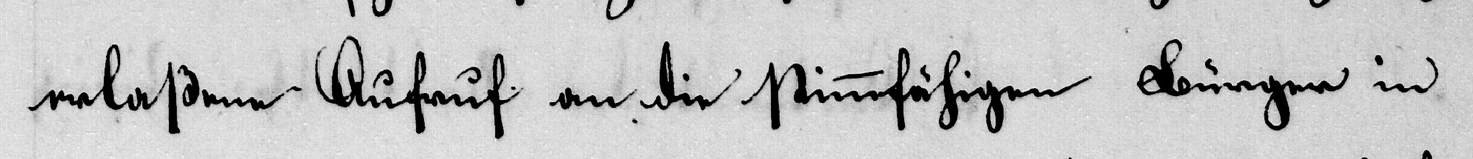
erlaßene Aufruf an die stimmfähigen Bürger in
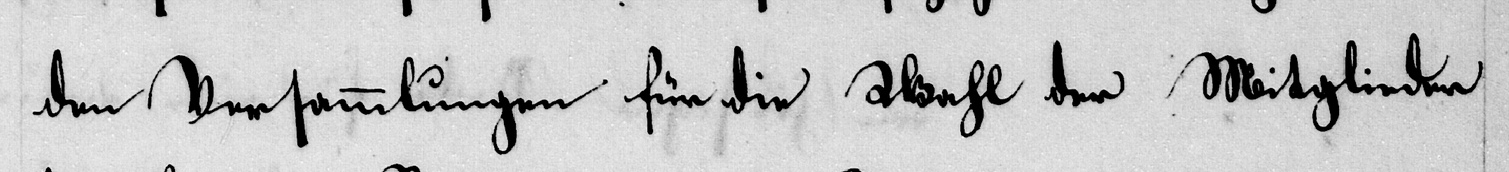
den Versammlungen für die Wahl der Mitglieder
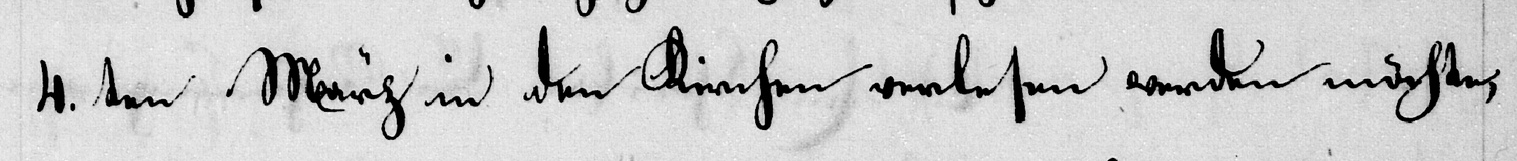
4.ten März in den Kirchen verlesen werden möchte,
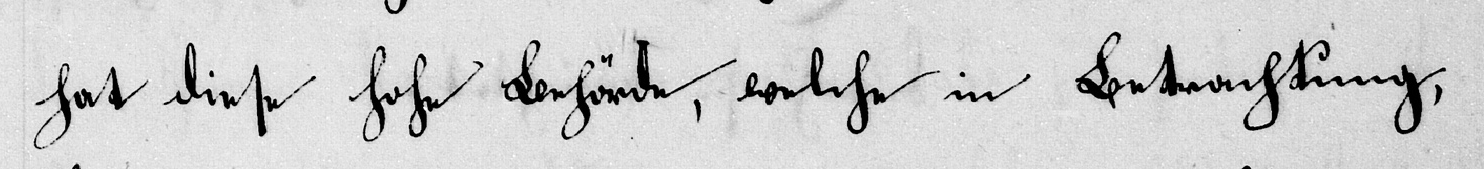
hat diese hohe Behörde, welche in Betrachtung,
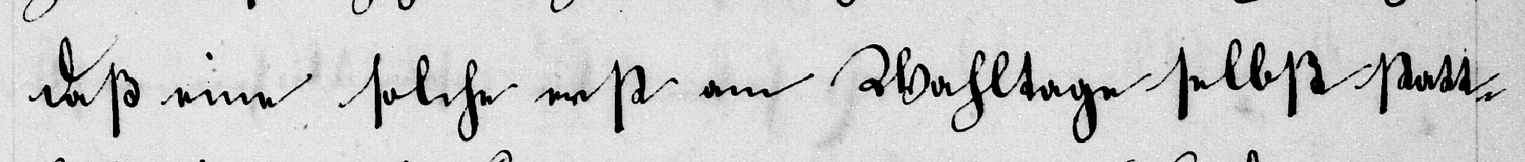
daß eine solche erst am Wahltage selbst statt¬
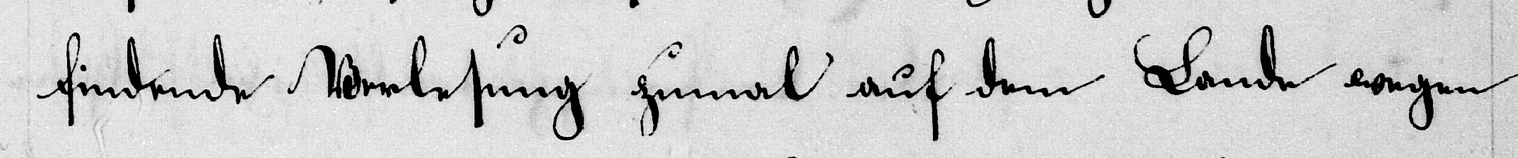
findende Verlesung zumal auf dem Lande wegen
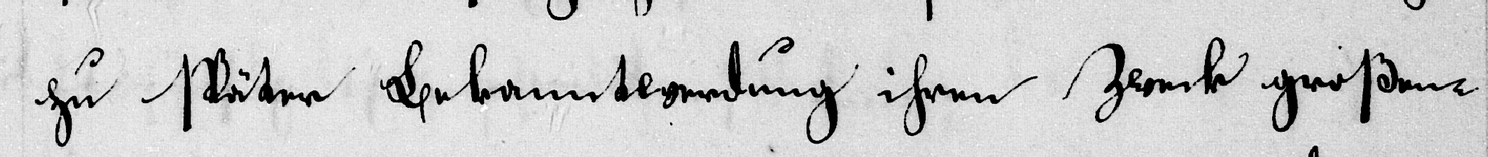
zu später Bekanntwerdung ihren Zwecke großen¬
